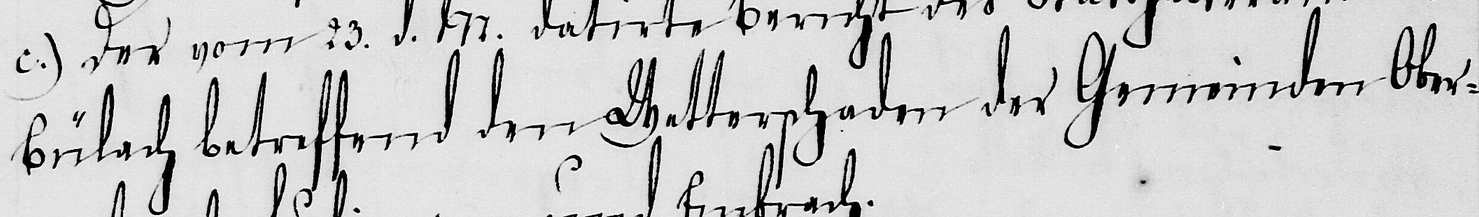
Bülach betreffend den Wetterschaden der Gemeinden Obe¬
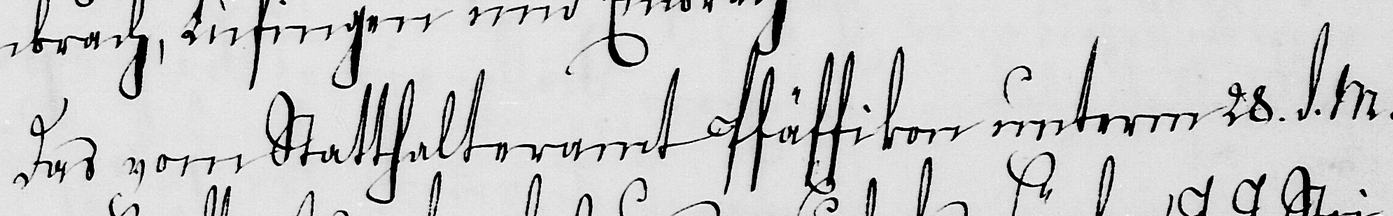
Das vom Statthalteramt Pfäffikon unterm 28. d. M.
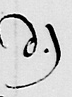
d.)
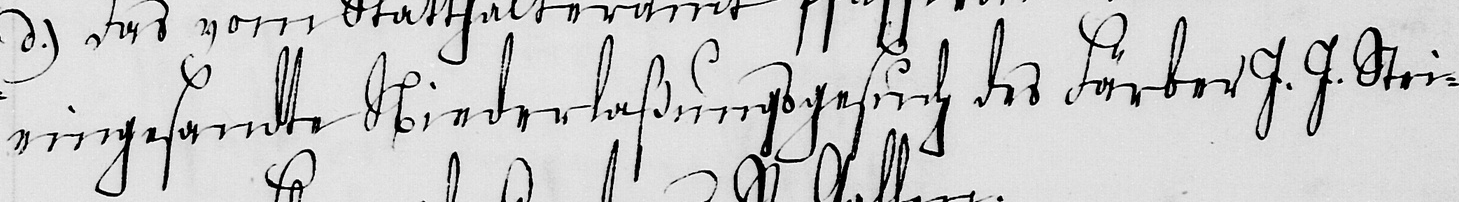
eingesandte Niederlaßungsgesuch des Färber J. J. Stei¬
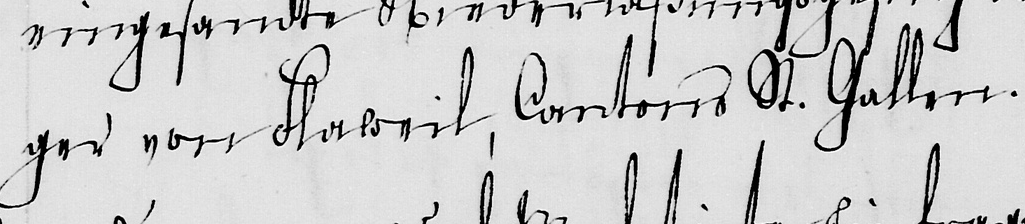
ger von Flaweil, Cantons St. Gallen.
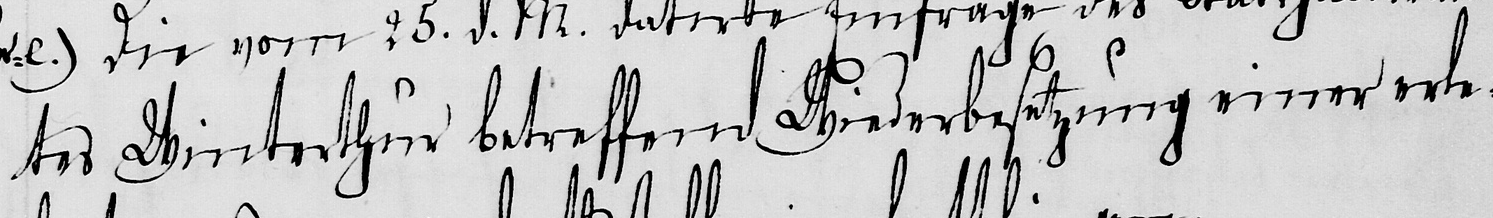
tes Winterthur betreffend Wiederbesetzung einer erle¬
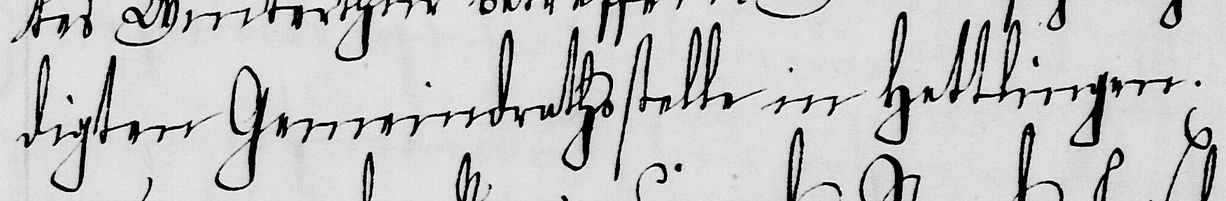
digten Gemeindrathsstelle in Hettlingen.
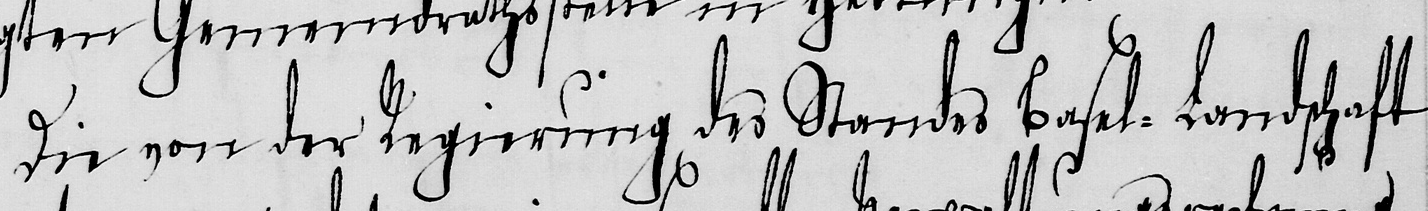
Die von der Regierung des Standes Basel-Landschaft
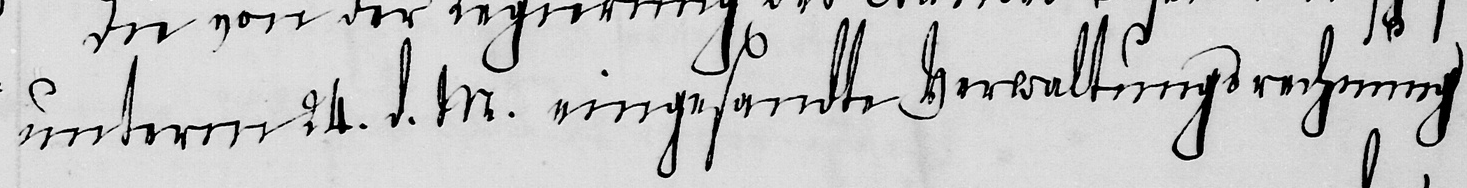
unterm 24. d. M. eingesandte Verwaltungsrechnung
